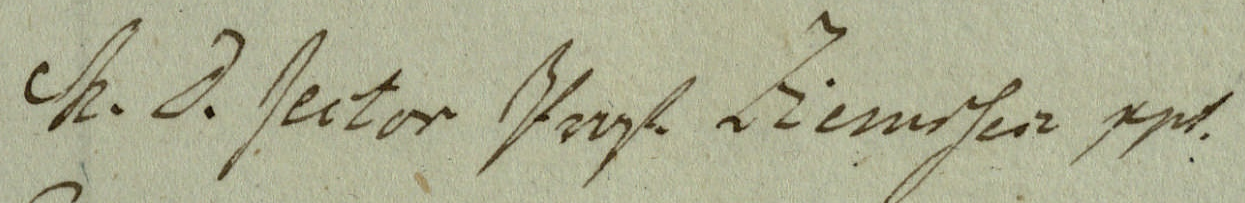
M. D. Rector Prof. Ziemssen ppt.
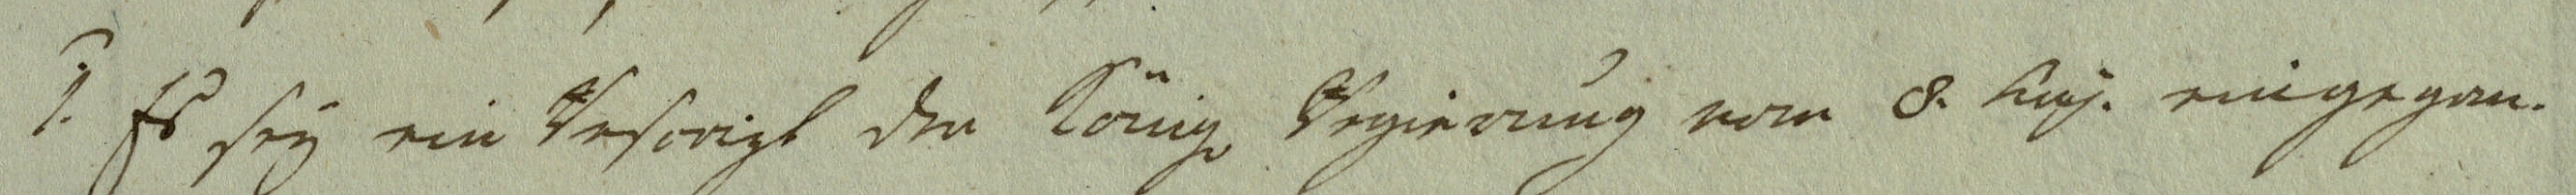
1. Es seÿ ein Rescript der Königl. Regierung vom 8. huj. eingegan¬
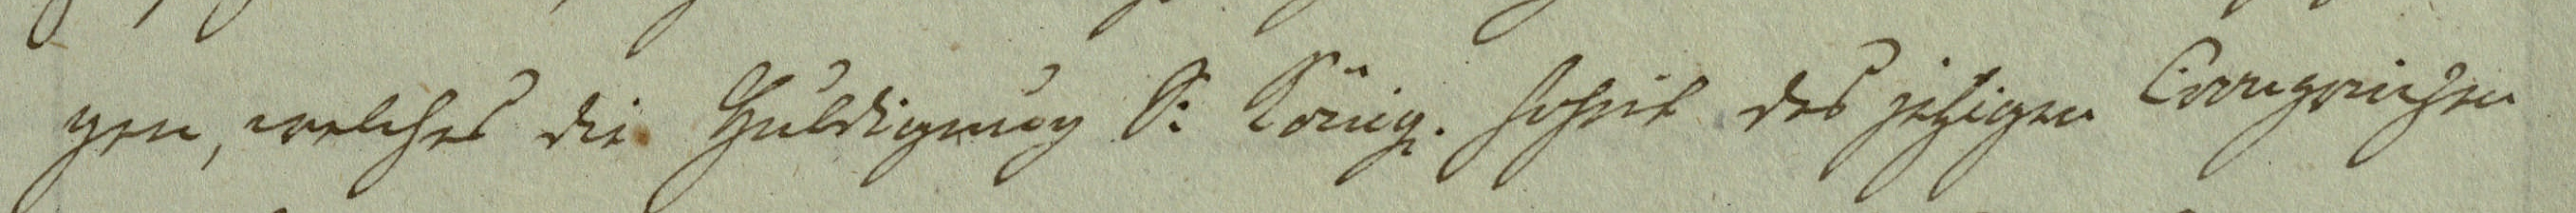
gen, welches die Huldigung Sr. Königl. Hoheit des jetzigen Cronprinzen
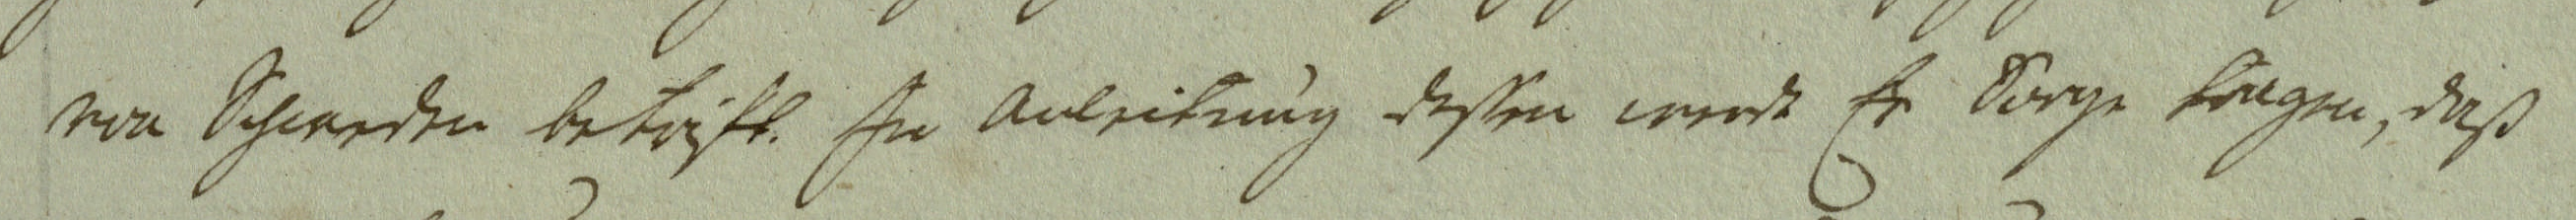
von Schweden betrift. In Anleitung dessen werde Er Sorge tragen, daß
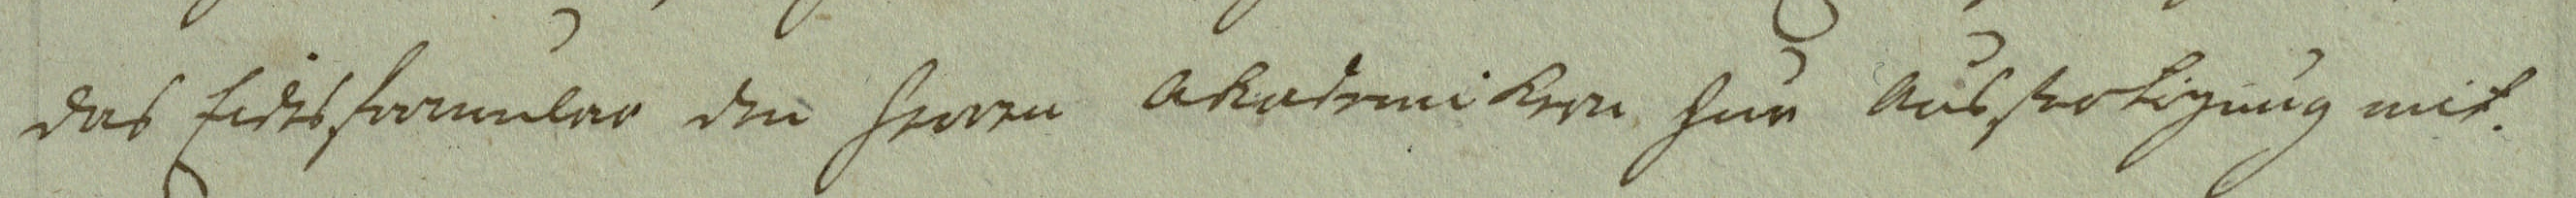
das Eidesformular den herren Akademikern zur Ausfertigung mit¬
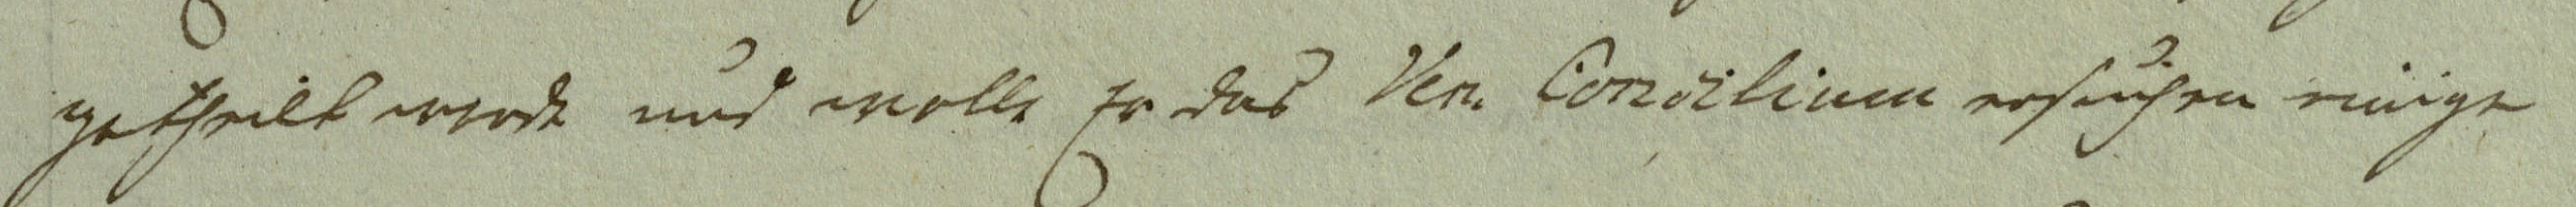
getheilt werde und wolle Er das Ven. Concilium ersuchen einige
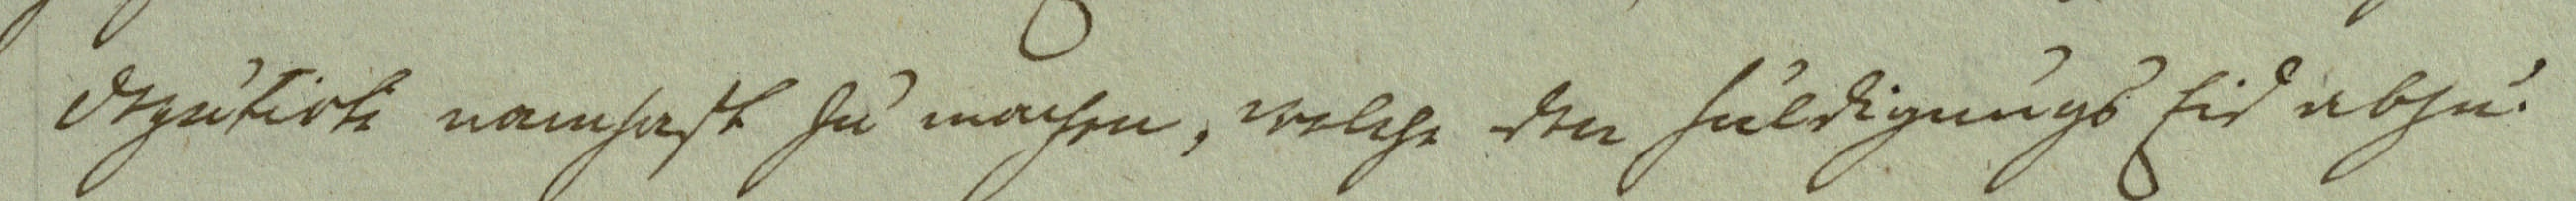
Deputirte namhaft zu machen, welche den Huldigungs Eid abzu¬
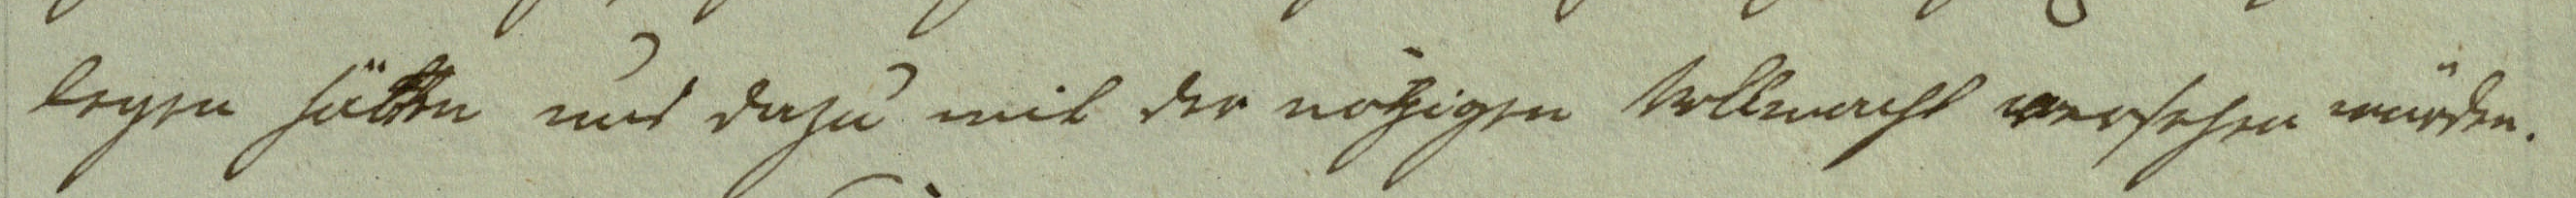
legen hätten und dazu mit der nöthigen Vollmacht versehen würden.
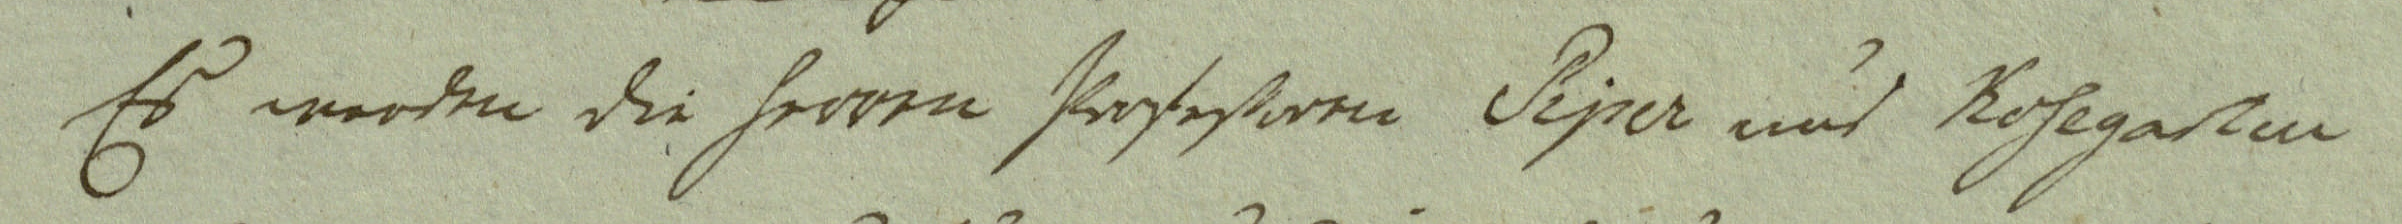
Es werden die Herren Professoren Piper und Kosegarten
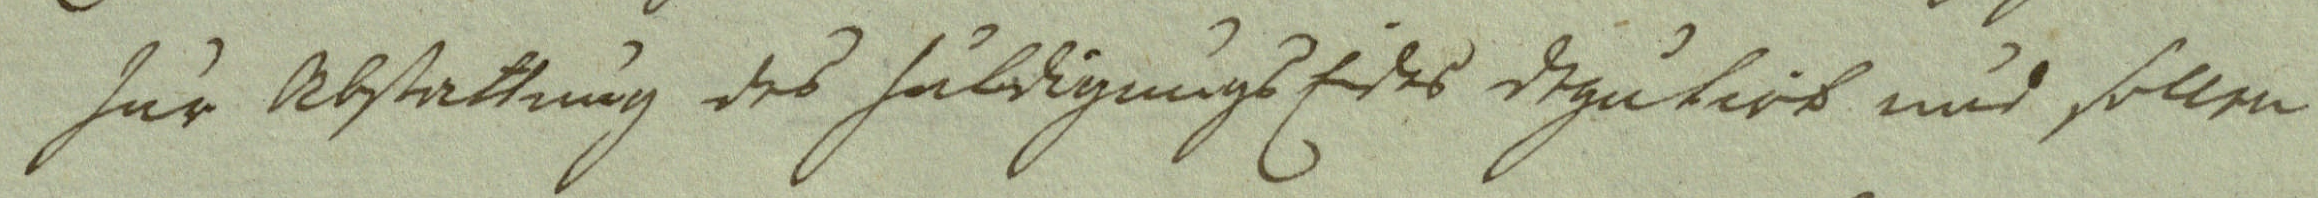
zur Abstattung des Huldigungs Eides deputirt und sollen
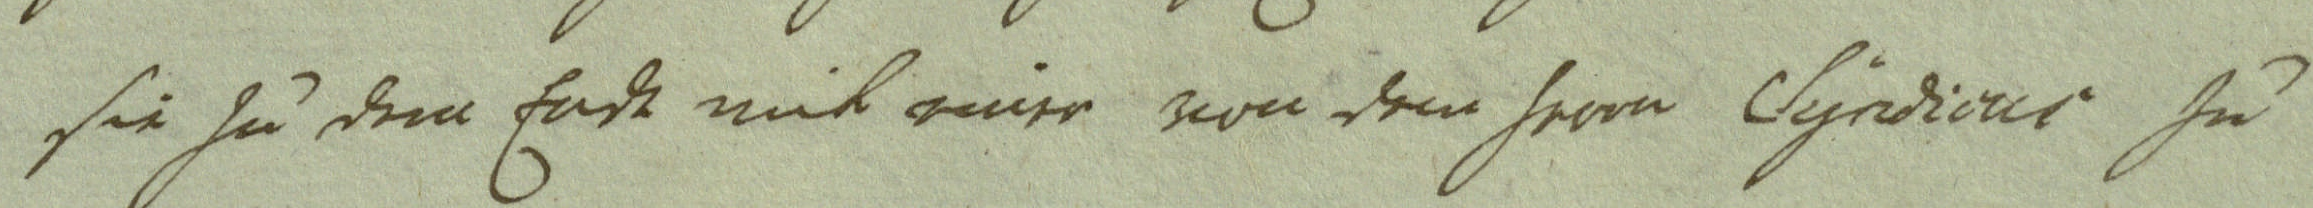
sie zu dem Ende mit einer von dem Herrn Sÿndicus zu
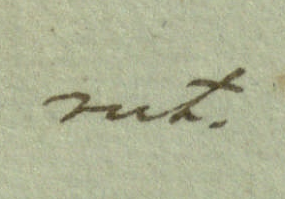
ent.
